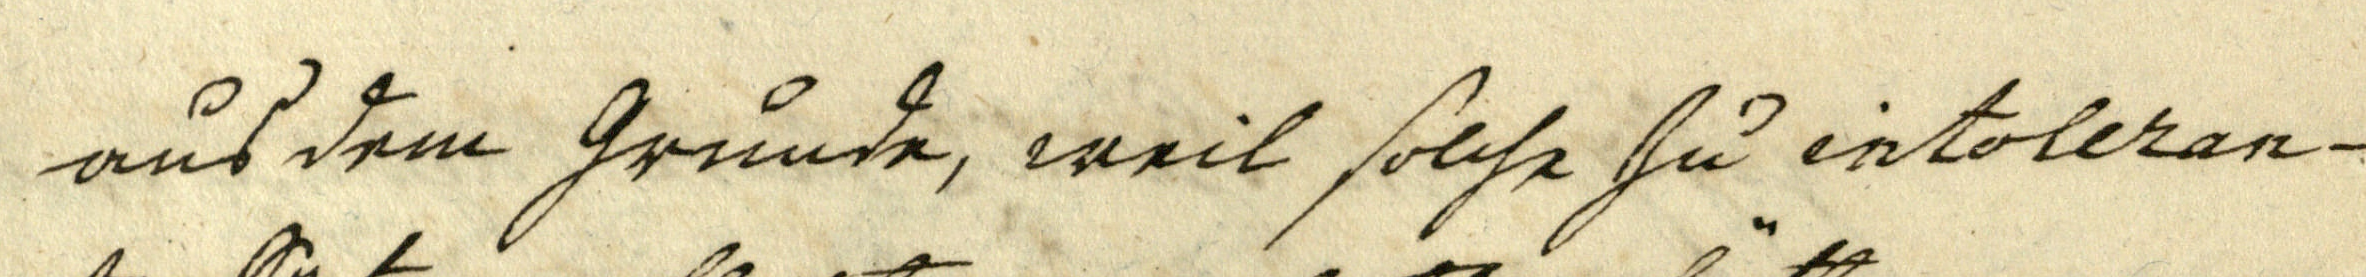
aus dem Grunde, weil solche zu intoleran¬
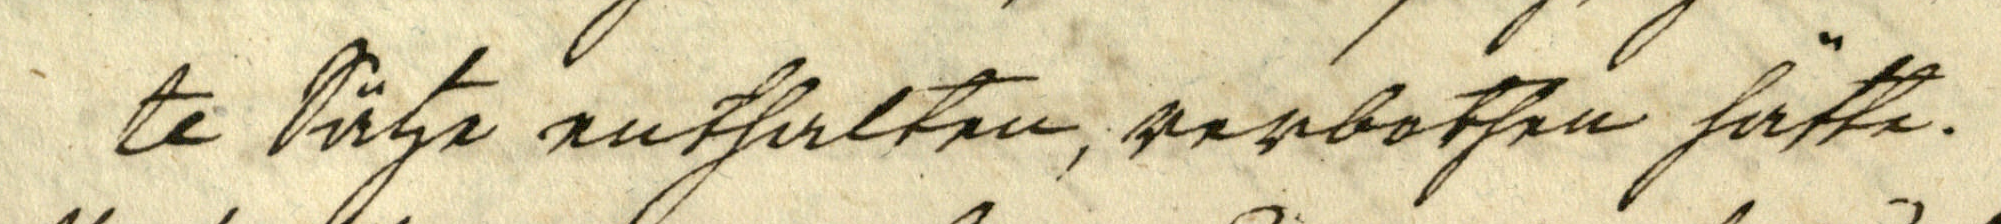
te Sätze enthalten, verbothen hätte.
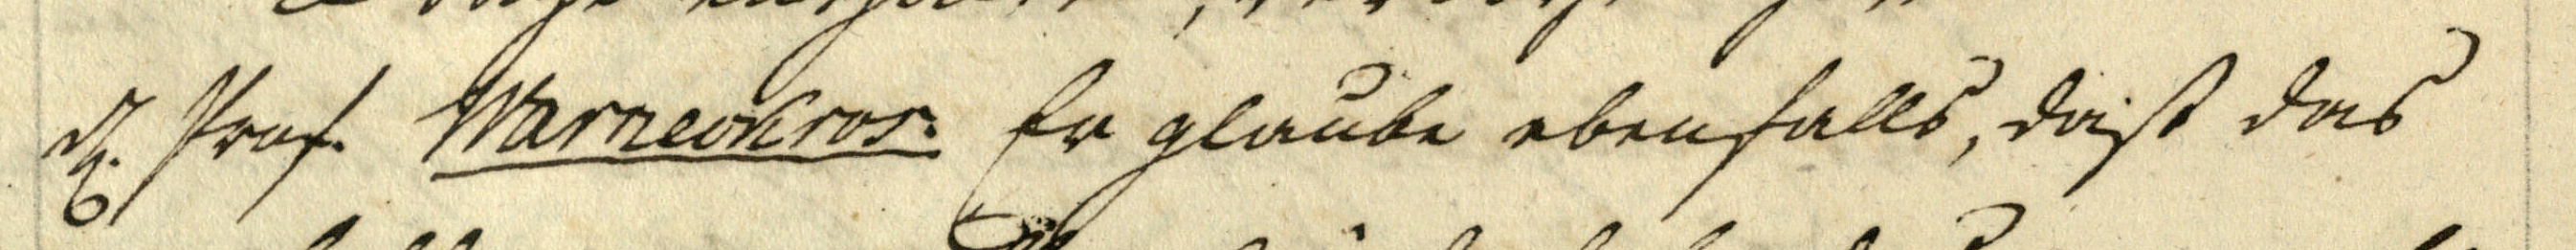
dh. Prof. Warneckros. Er glaube ebenfalls, daß das
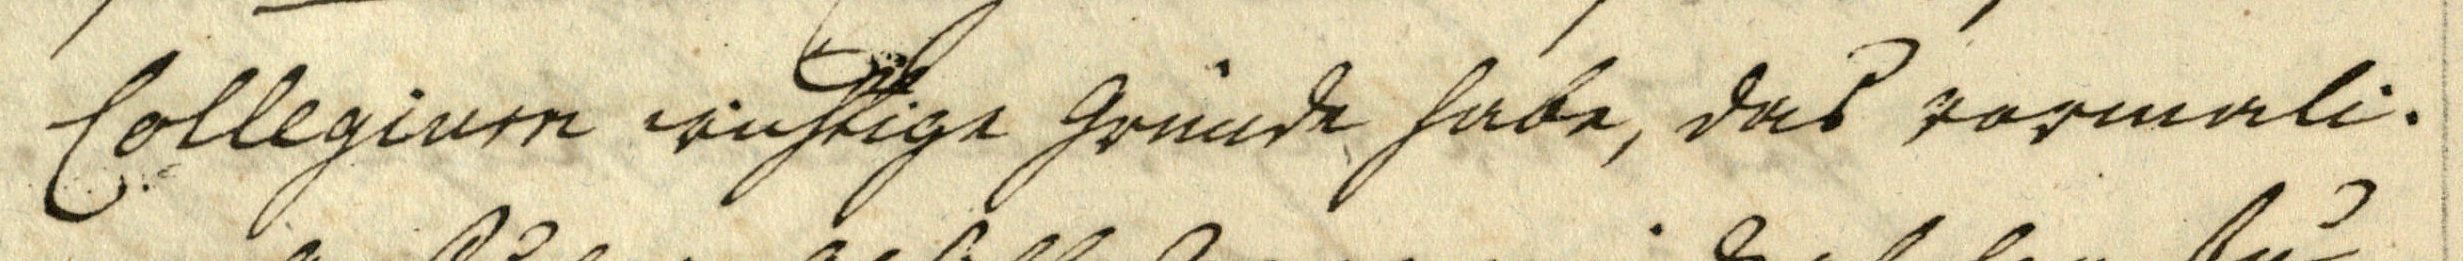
Collegium wichtige Gründe habe, das vormali¬
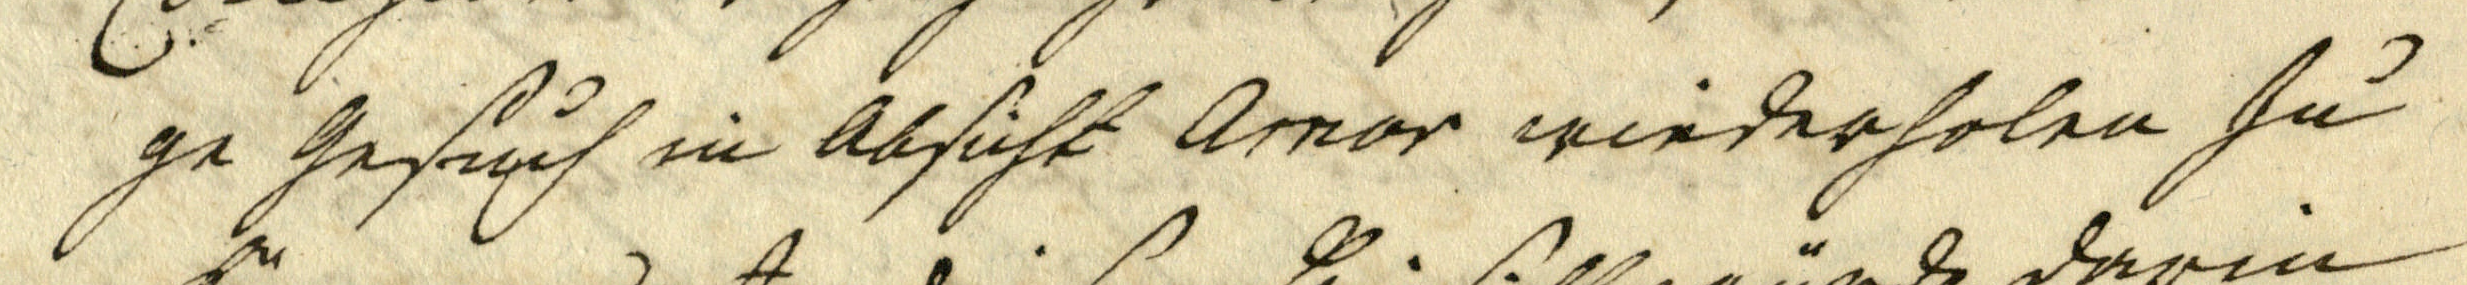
ge Gesuch in Absicht Amor wiederholen zu
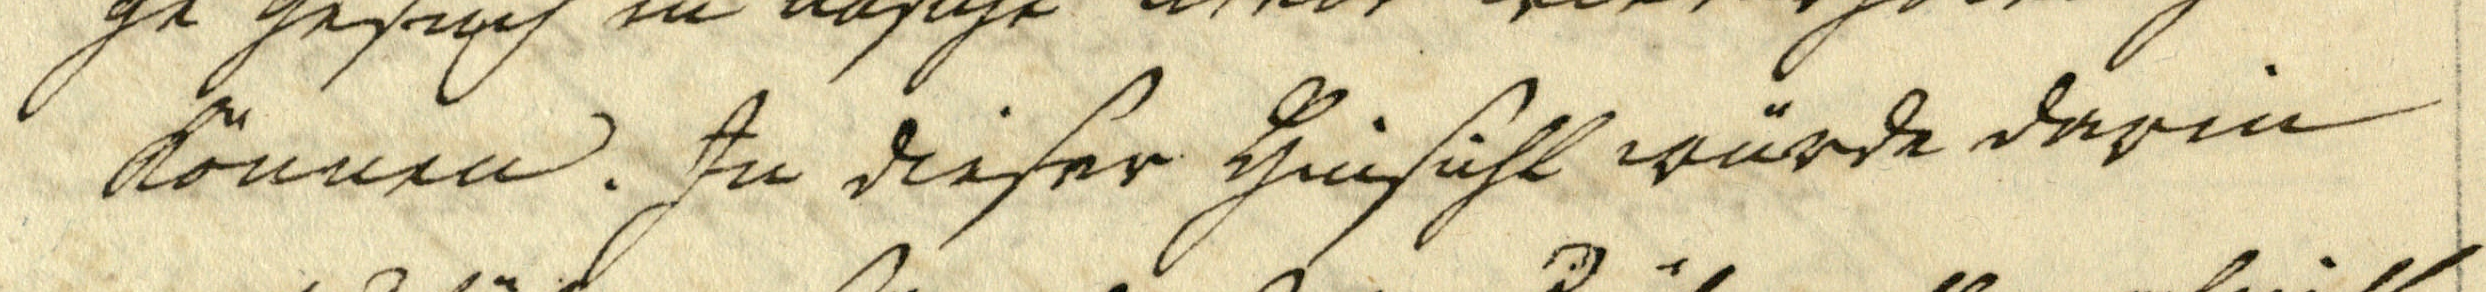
können. In dieser Hinsicht würde darin
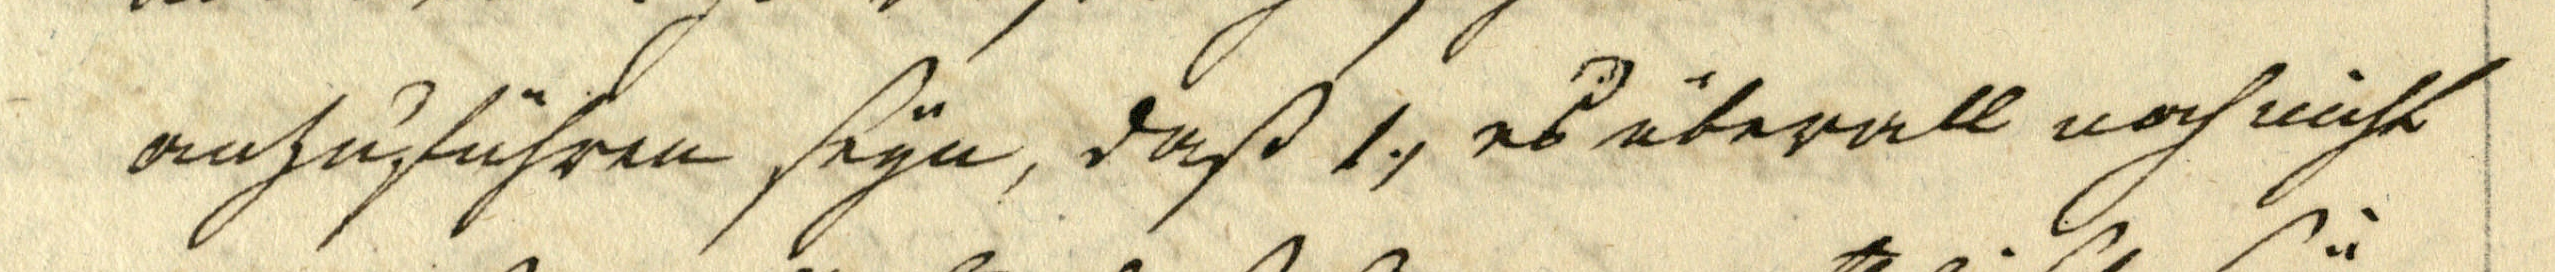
anzuführen seÿn, daß 1., es überall noch nicht
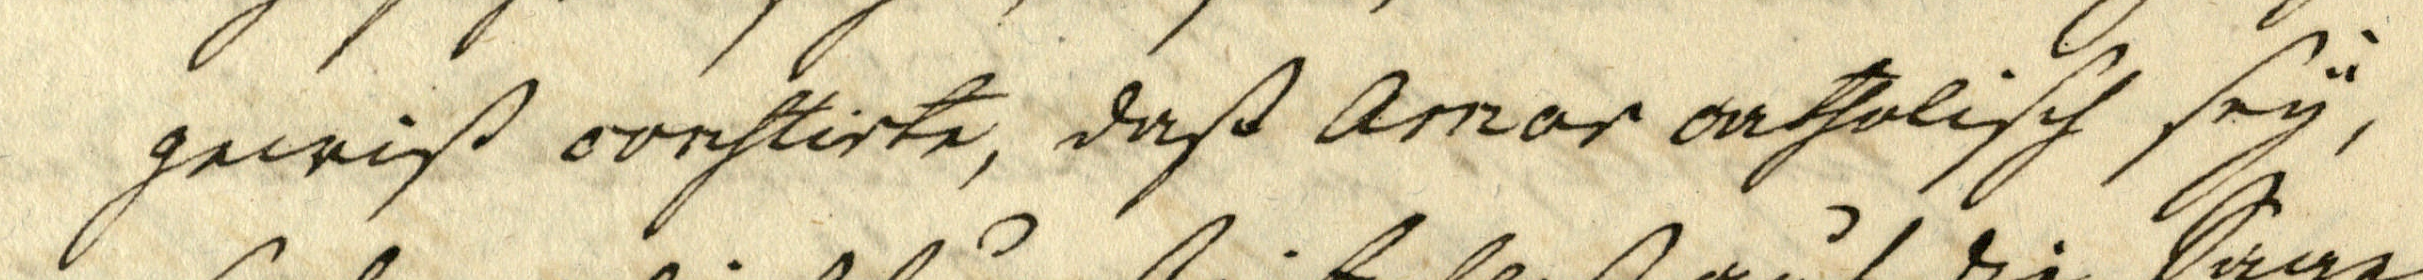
gewiß constirte, daß Amor catholisch seÿ,
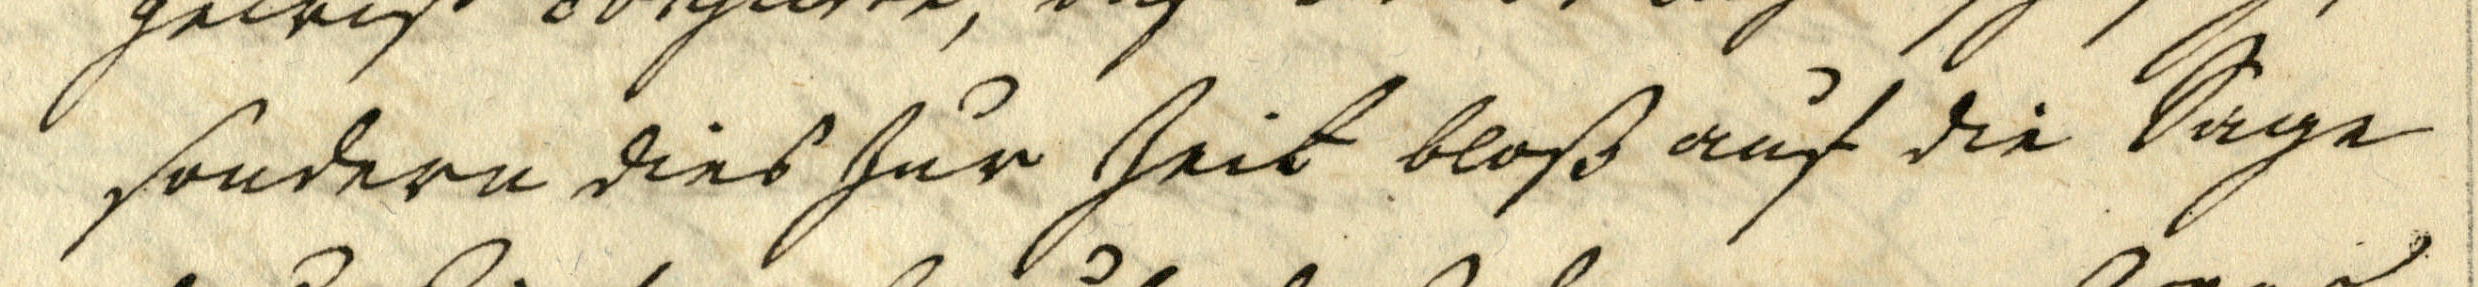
sondern dies zur Zeit bloß auf die Sage
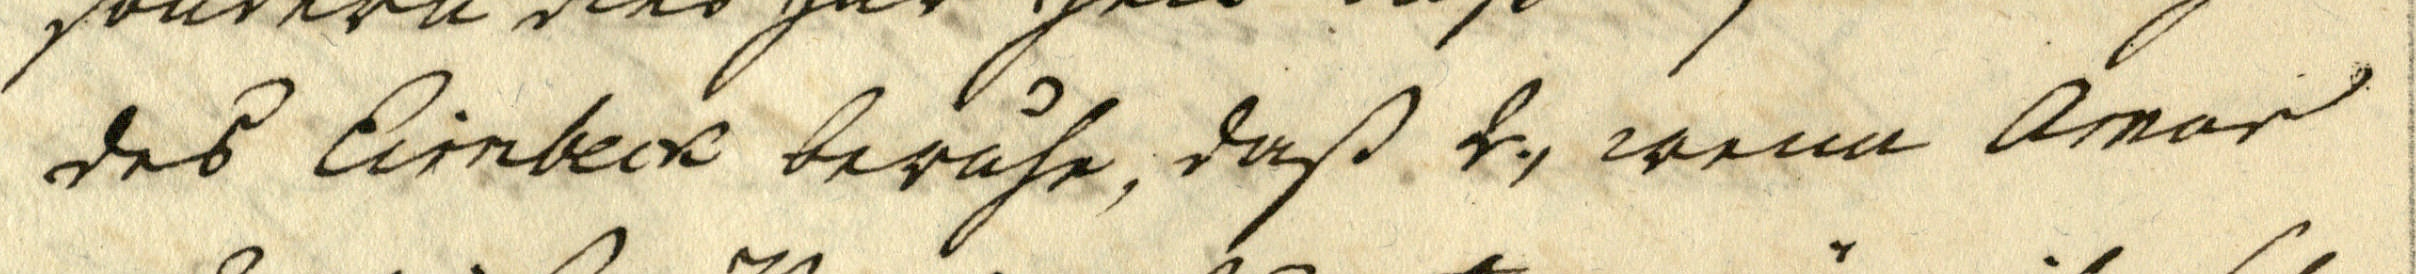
des Eimbeck beruhe, daß 2., wenn Amor
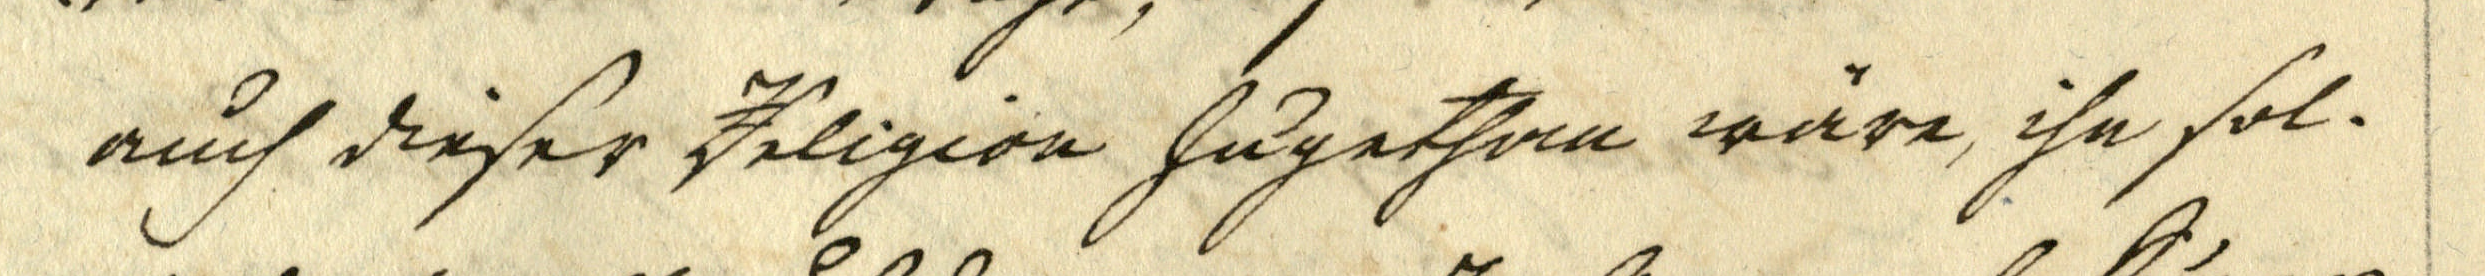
auch dieser Religion zugethan wäre, ihn sol¬
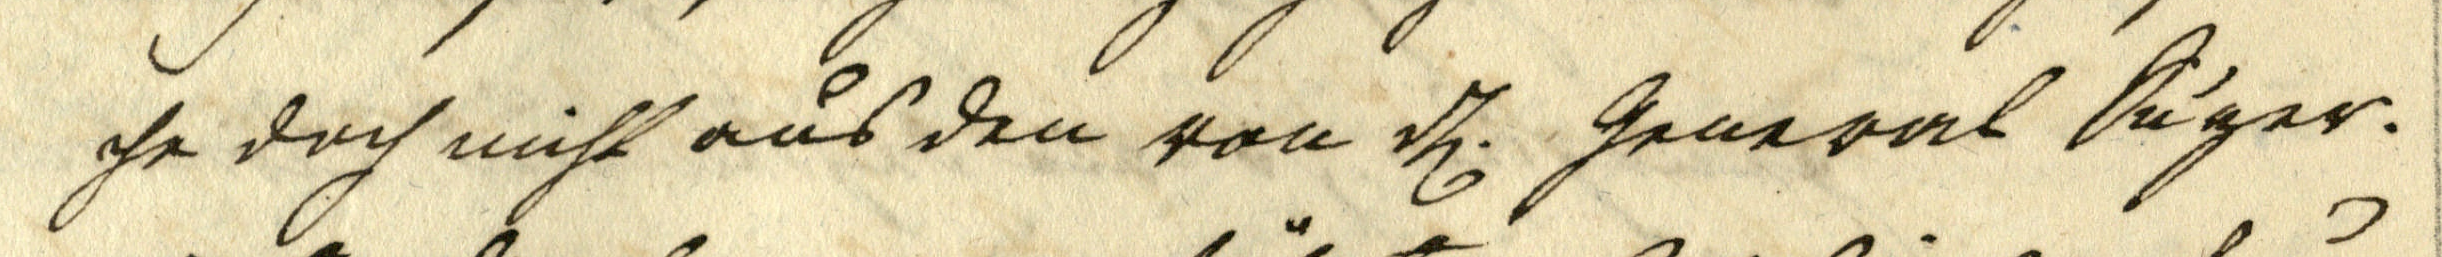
che doch nicht aus den von dh. General Super¬
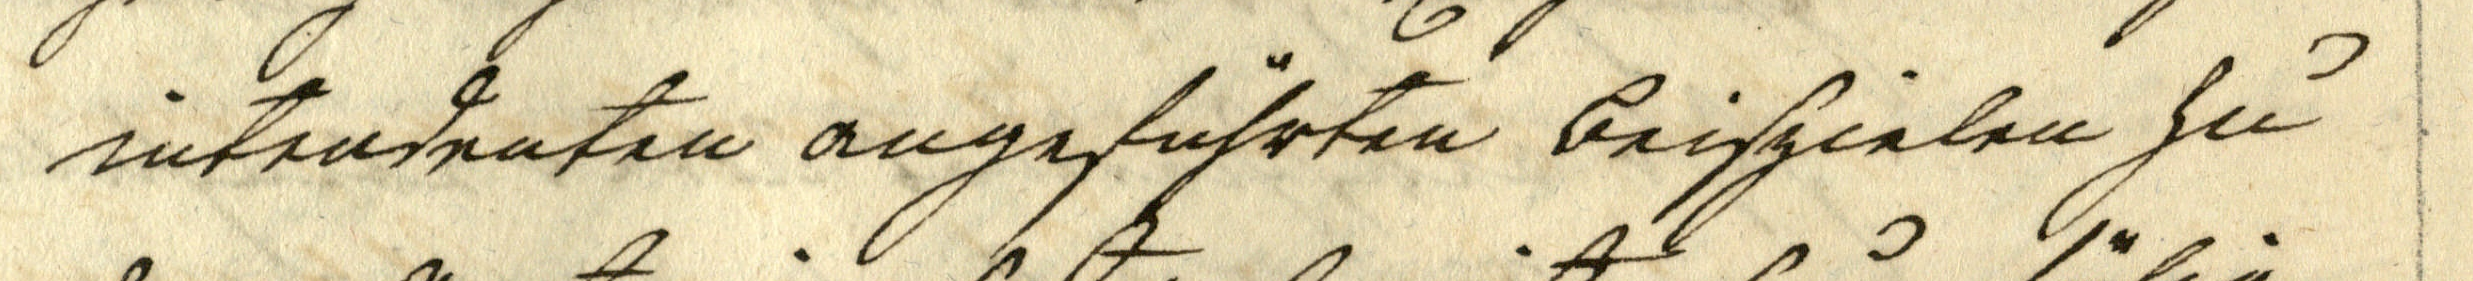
intendenten angeführten Beispielen zu
